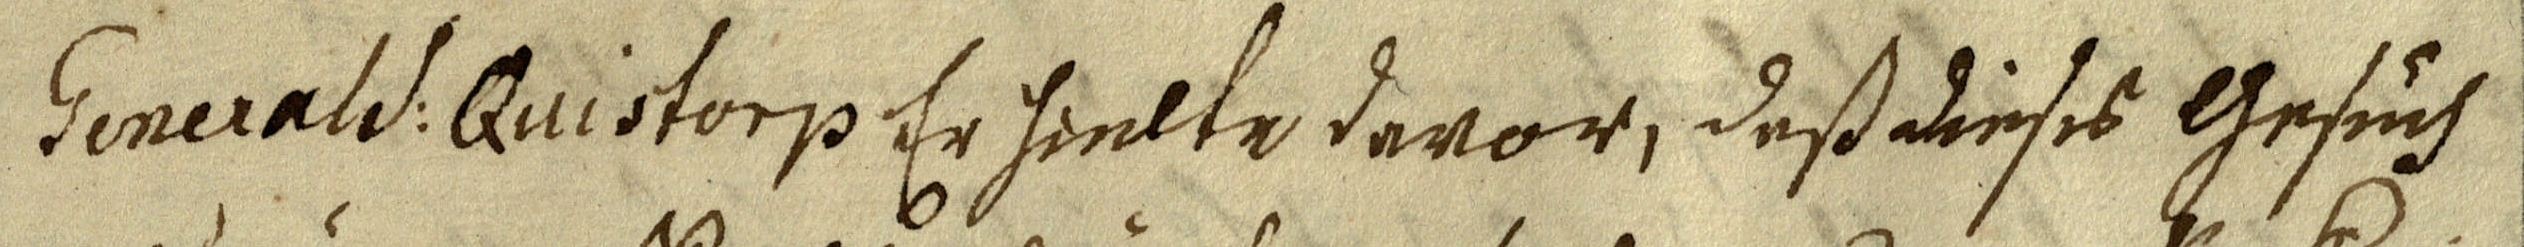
dh GeneralS. Quistorp Er hielte davor, daß dieses Gesuch
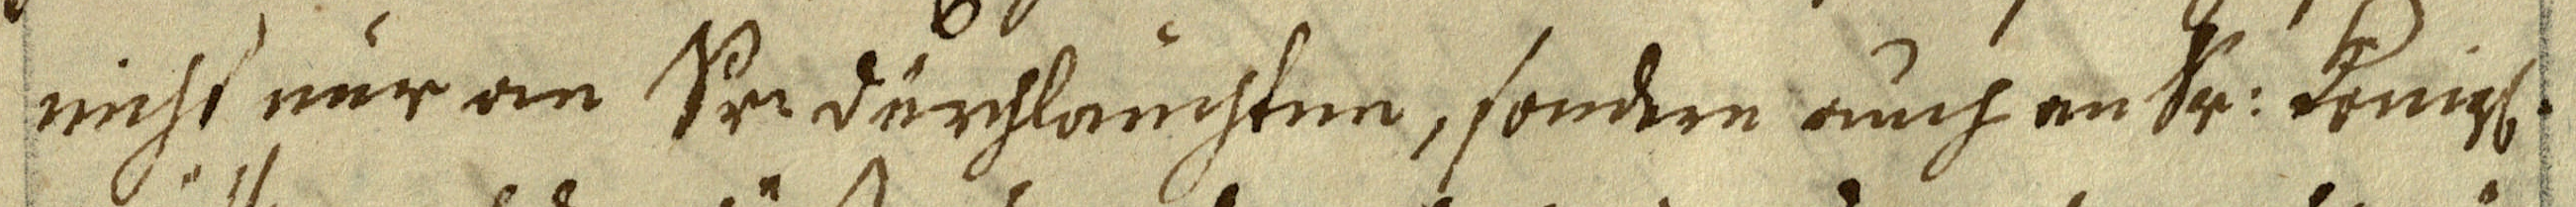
nicht nur an Sr Durchlauchten, sondern auch an Sr. Königl.
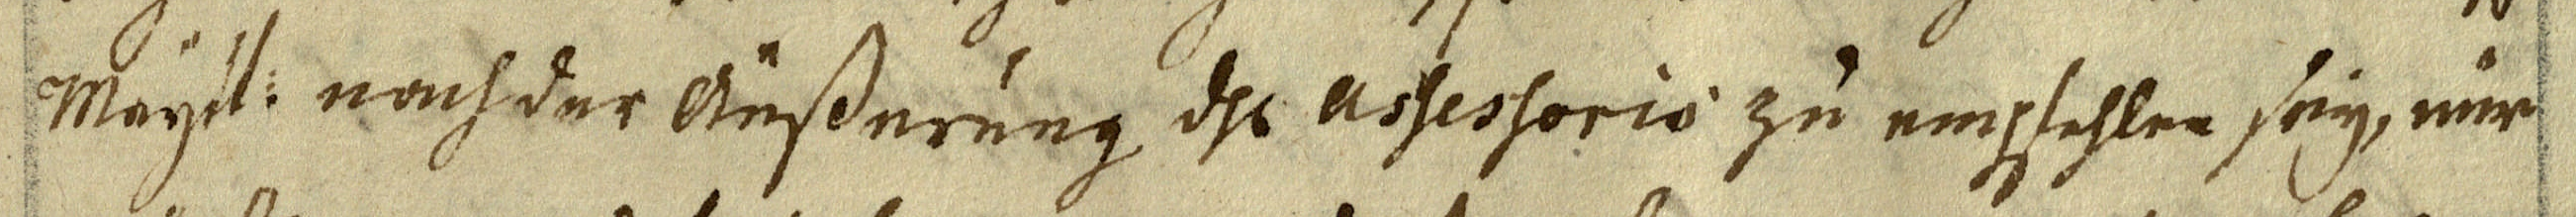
Maÿtt. nach der Äußerung dh Assessoris zu empfehlen seÿ, nur
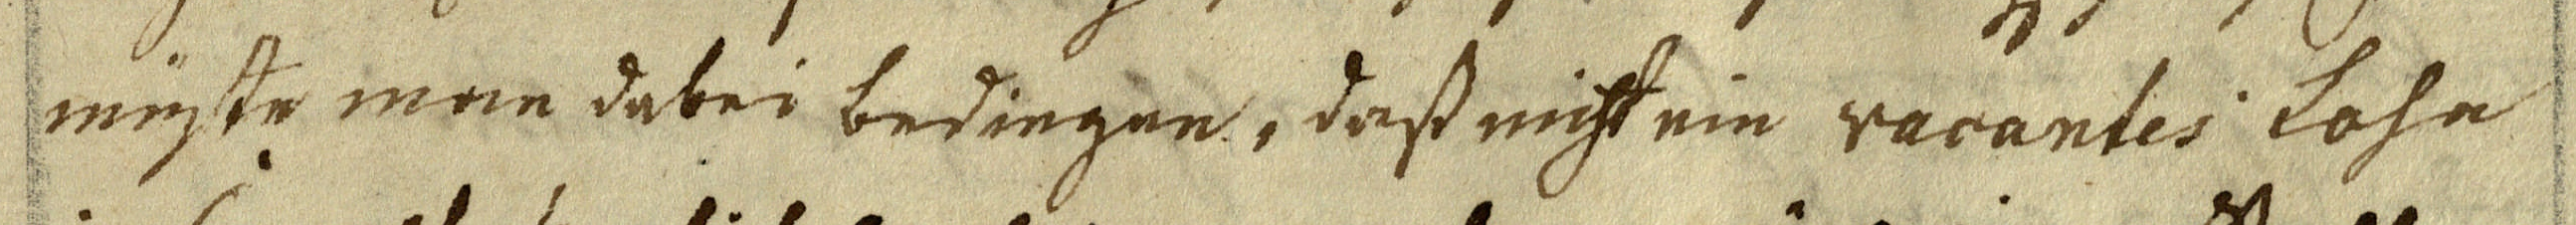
müste man dabei bedingen, daß nicht ein vacantes Lohn
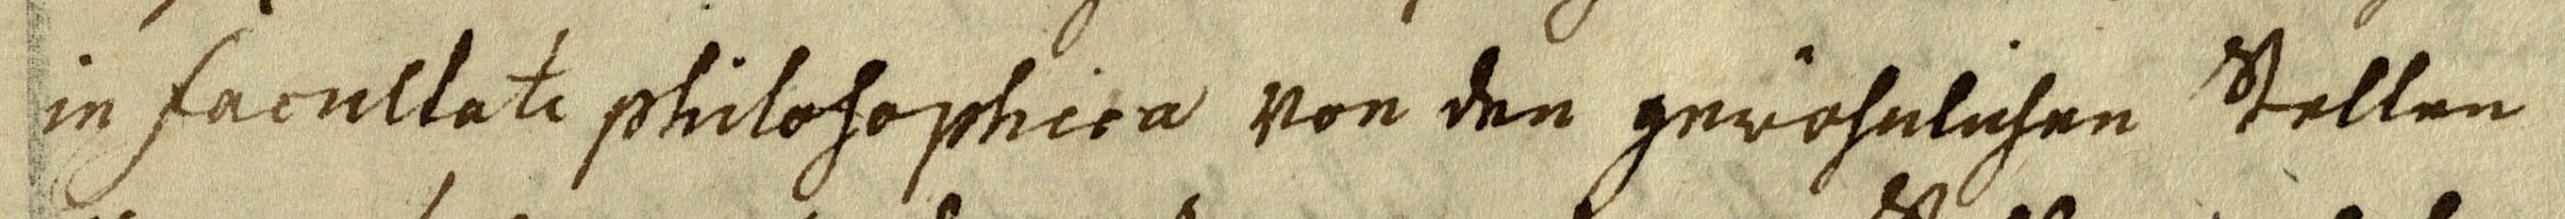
in Facultate philosophica von den gewöhnlichen Stellen
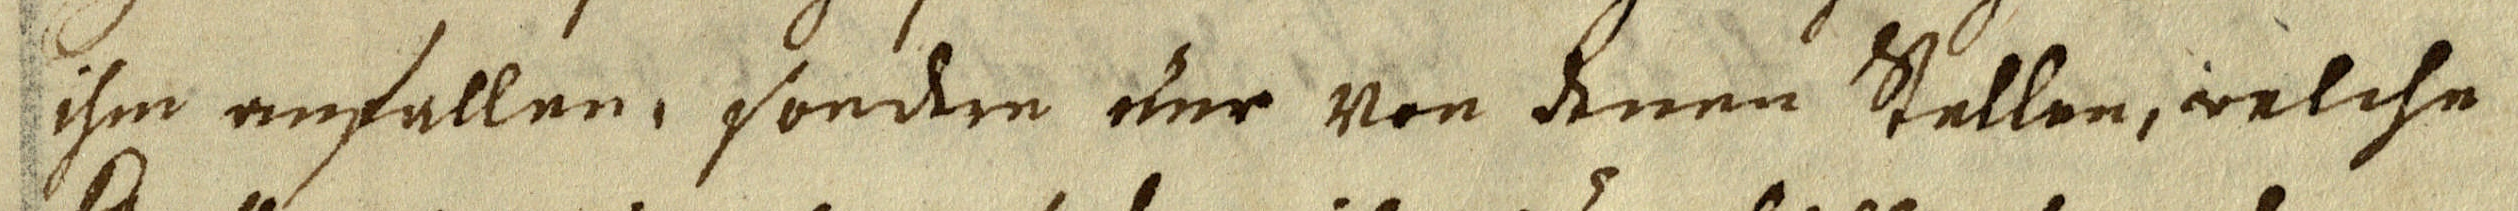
ihm anfallen, sondern nur von denen Stellen, welche
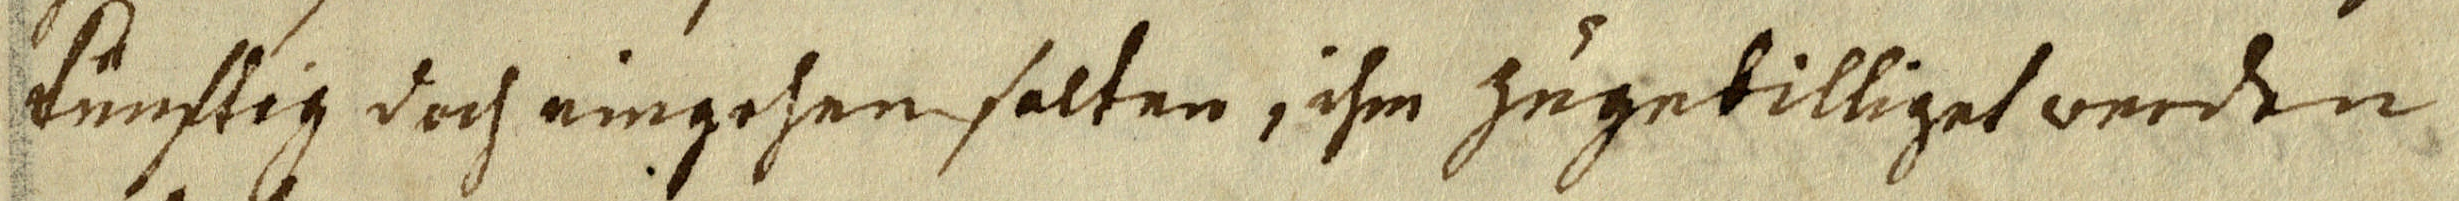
künftig doch eingehen solten, ihm zugebilliget werden
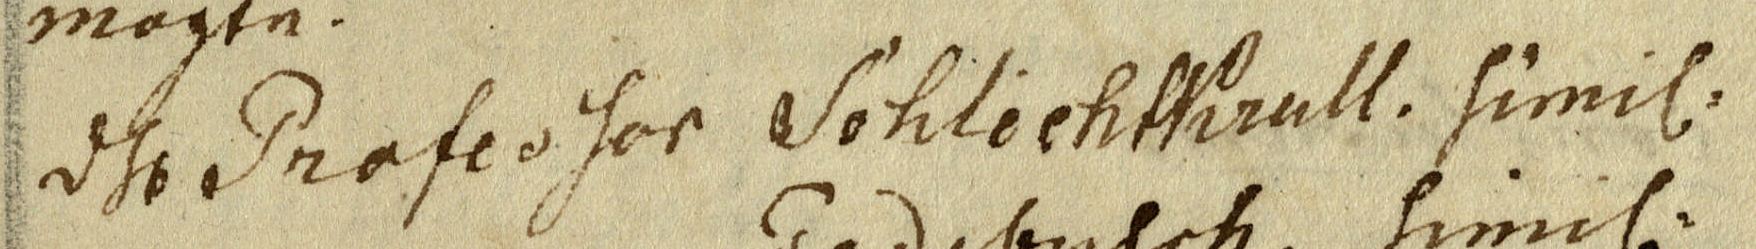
dh Professor Schlichtkrull simil.
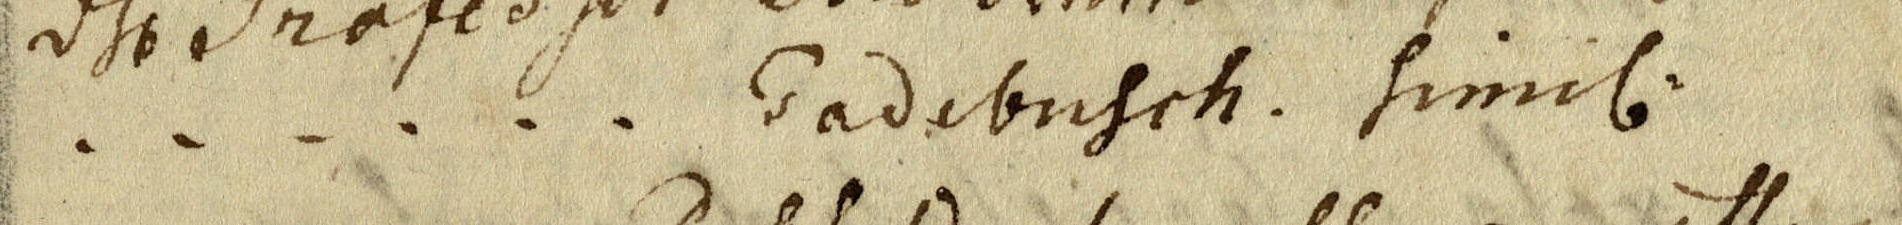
Gadebusch simil.
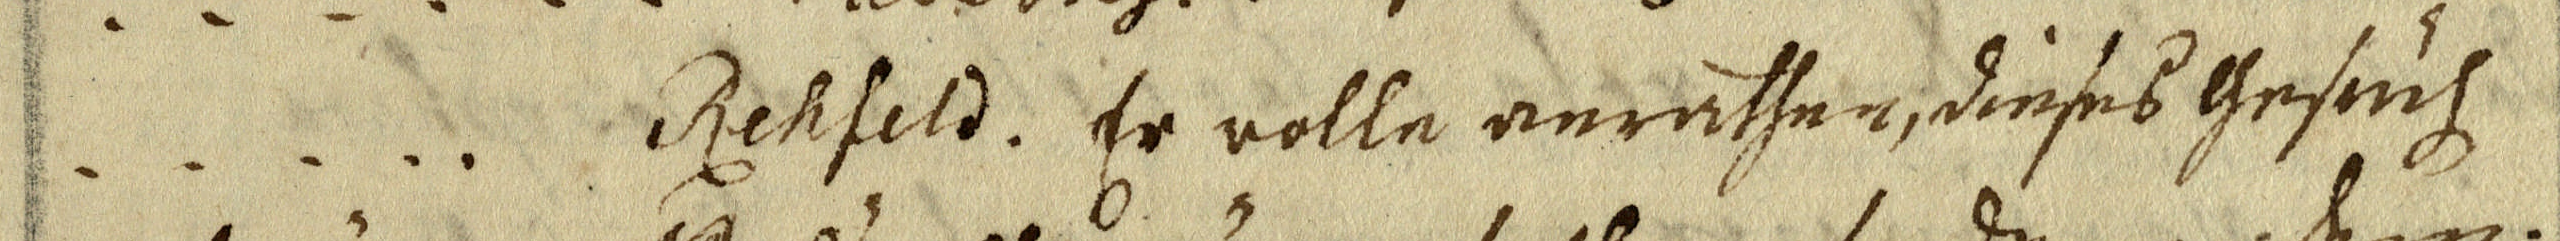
Rehfeld. Er wolle anrathen, dieses Gesuch
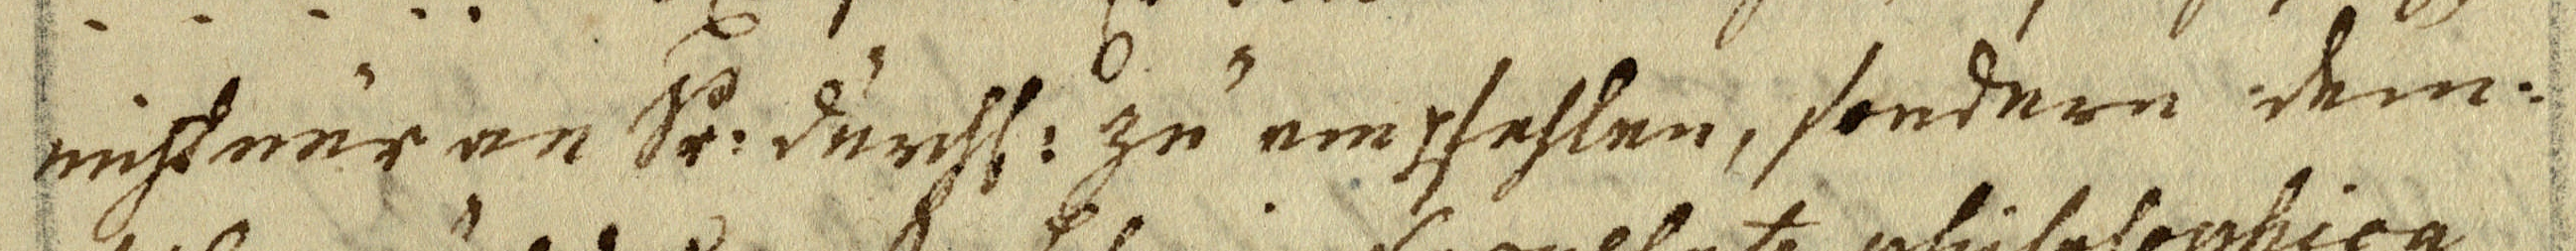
nicht nur an Sr. Durchl. zu empfehlen, sondern dem¬
